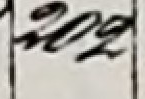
202
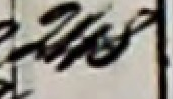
248
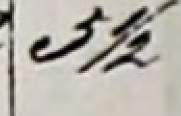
5 1/2
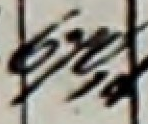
670,4
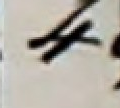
4
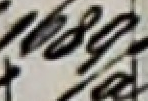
1689/a
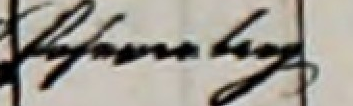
???berg
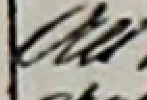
Alt
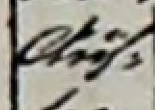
Auf„
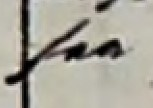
see
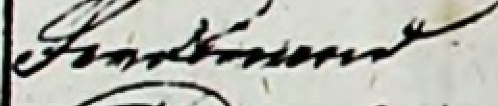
Ferdinand
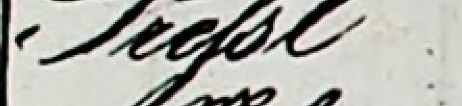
Pressl
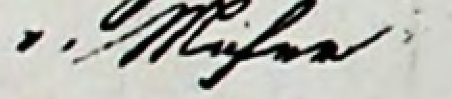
v. Micher
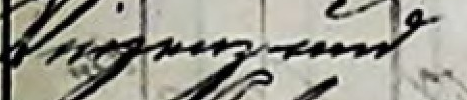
Vinzenz und
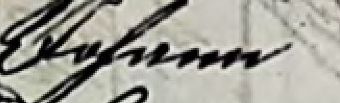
Johann
